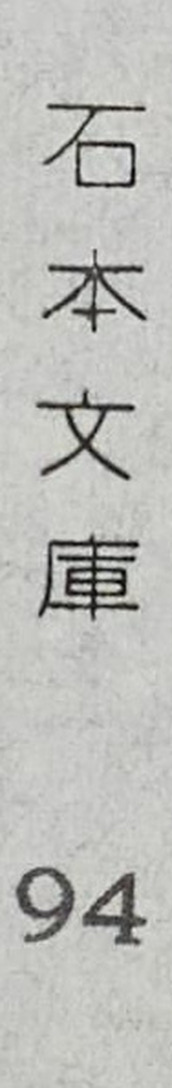石本文庫
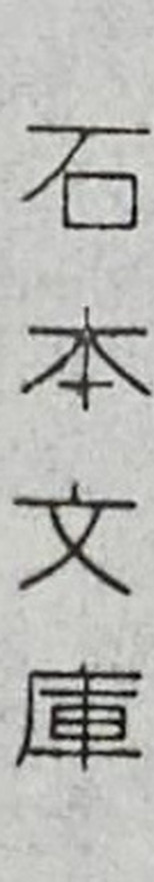石本文庫

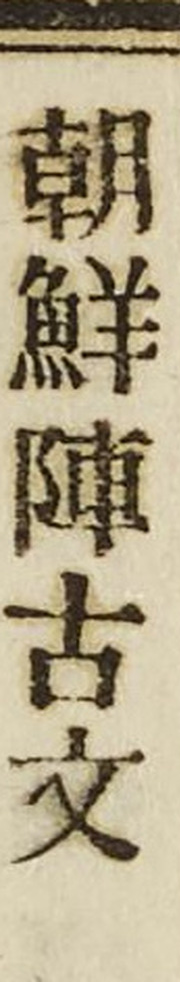朝鮮陣古文
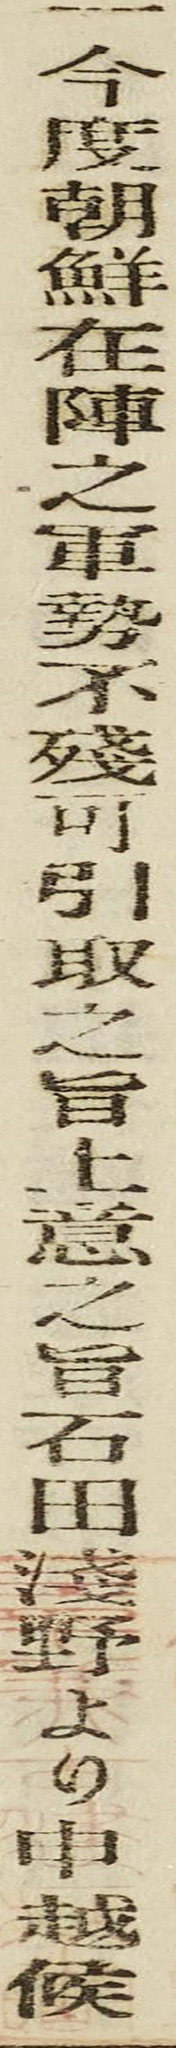一今度朝鮮在陣之軍勢不残可引取之旨上意之旨石田浅野より申越候
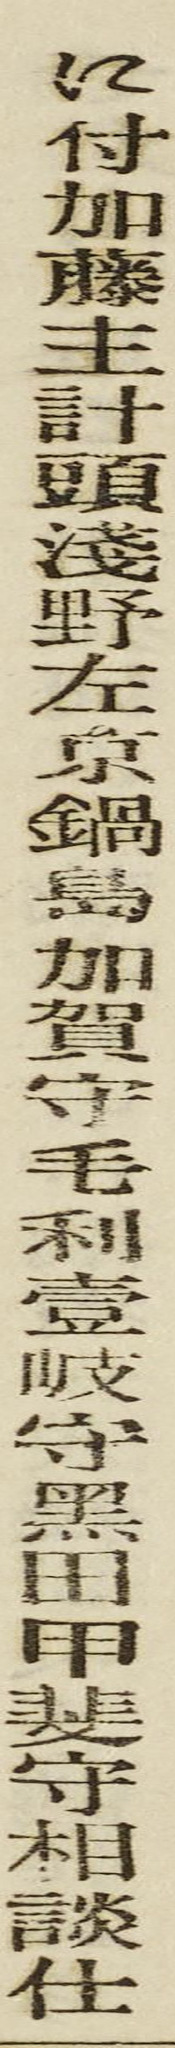に付加藤主計頭浅野左京鍋島加賀守毛利壱岐守黒田甲斐守相談仕
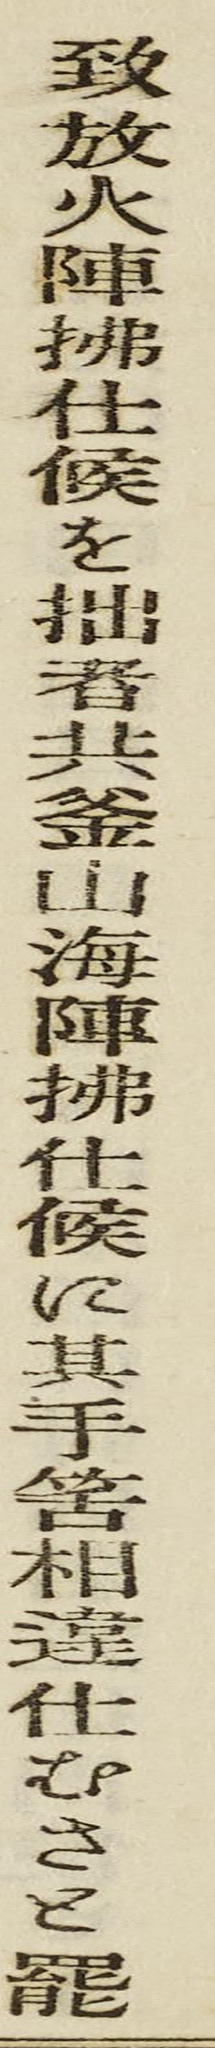致放火陣払仕候を拙者共釜山海陣払仕候に其手筈相違仕むさと罷
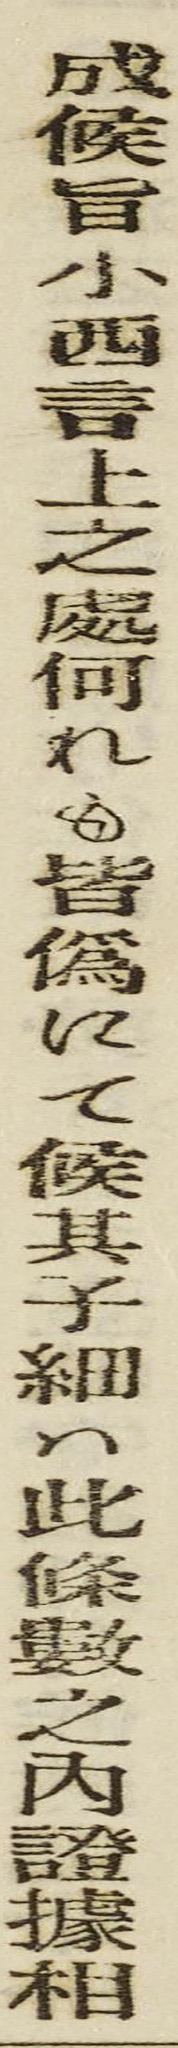成候旨小西言上之処何れも皆偽にて候其子細は此条数之内証拠相
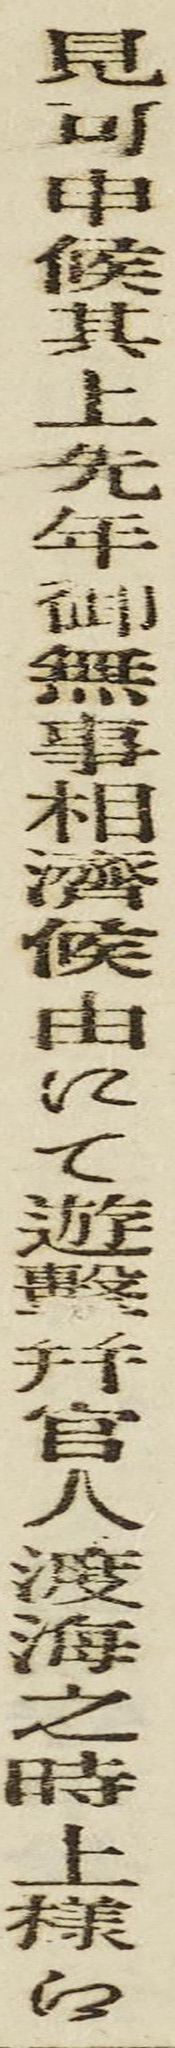見可申候其上先年御無事相済候由にて遊撃幷官人渡海之時上様え
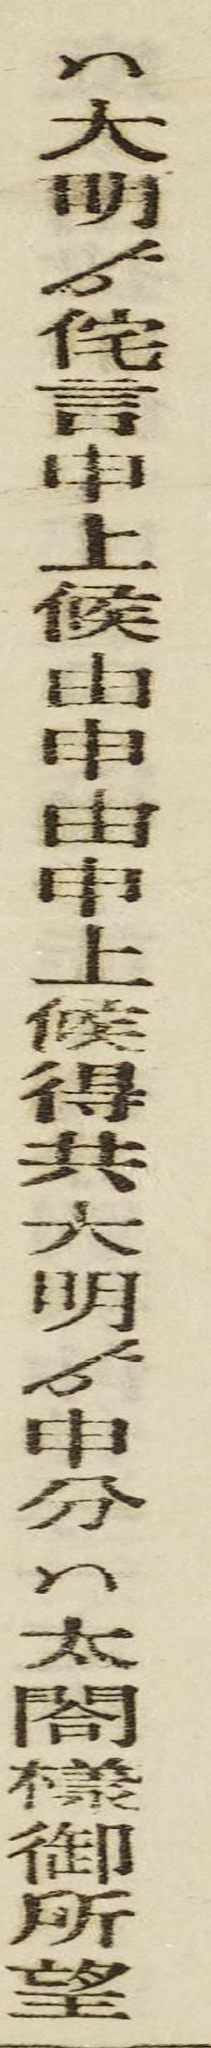は大明ゟ侘言申上候由申由申上候得共大明ゟ申分は太閤様御所望
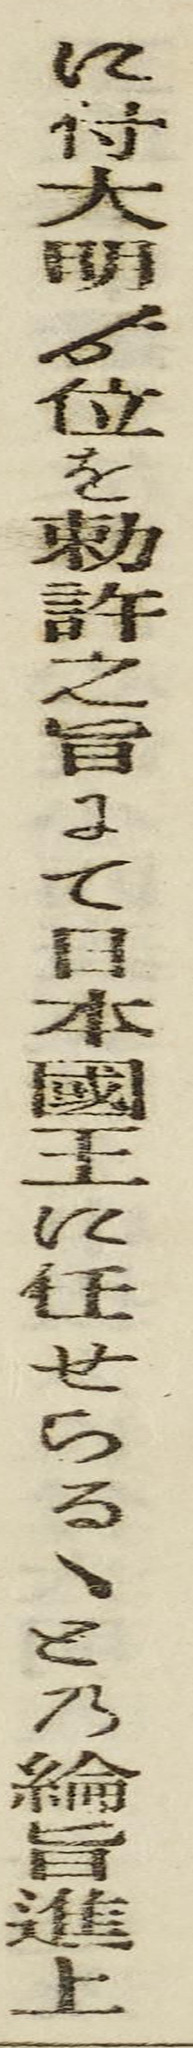に付大明ゟ位を勅許之旨にて日本国王に任せらるゝとの綸旨進上
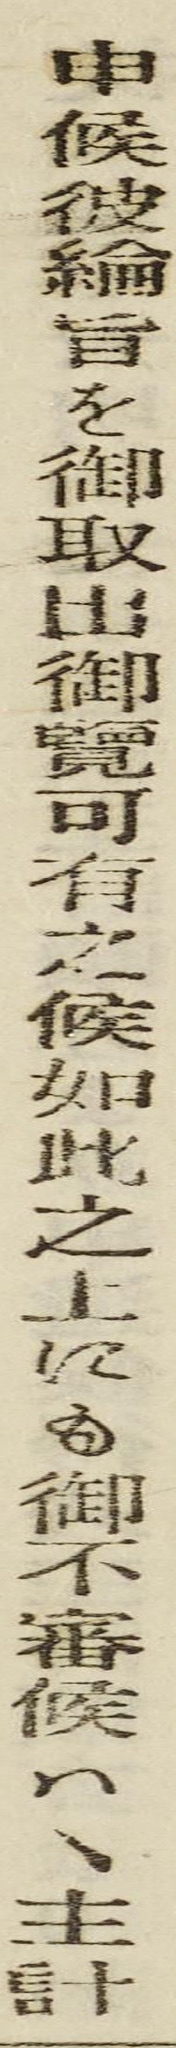申候彼綸旨を御取出御覧可有之候如此之上にも御不審候はゝ主計
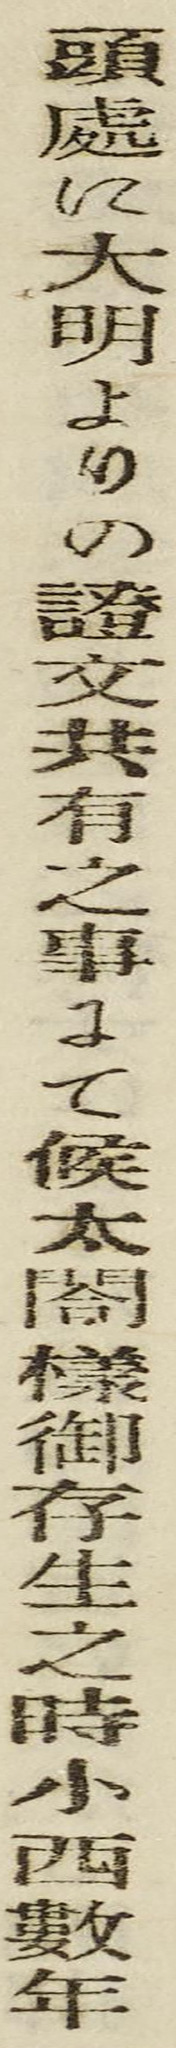頭処に大明よりの証文共有之事にて候太閤様御存生之時小西数年
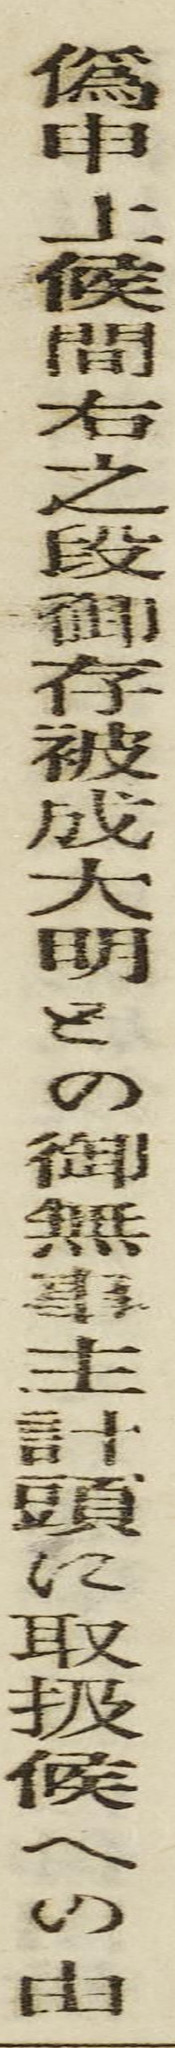偽申上候間右之段御存被成大明との御無事主計頭に取扱候への由

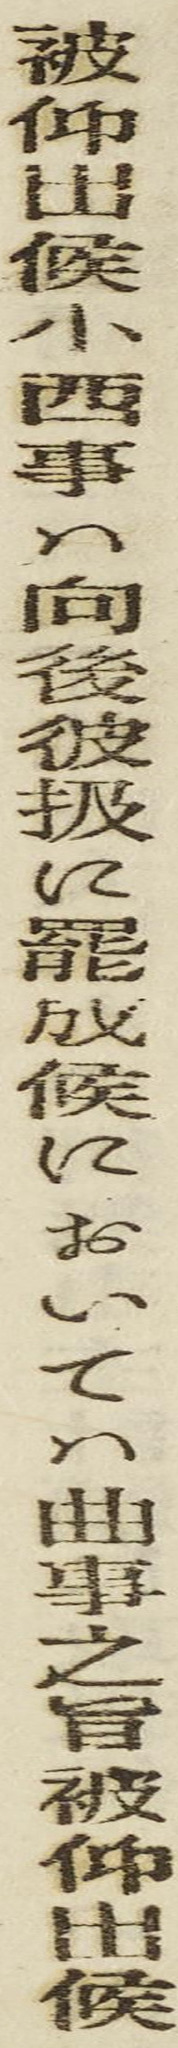被仰出候小西事は向後彼扱に罷成候においては曲事之旨被仰出候
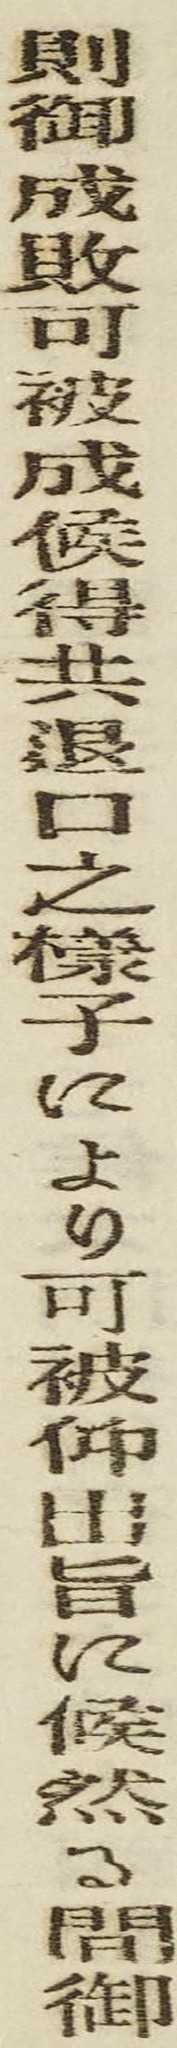則御成敗可被成候得共退口之様子により可被仰出旨に候然る間御
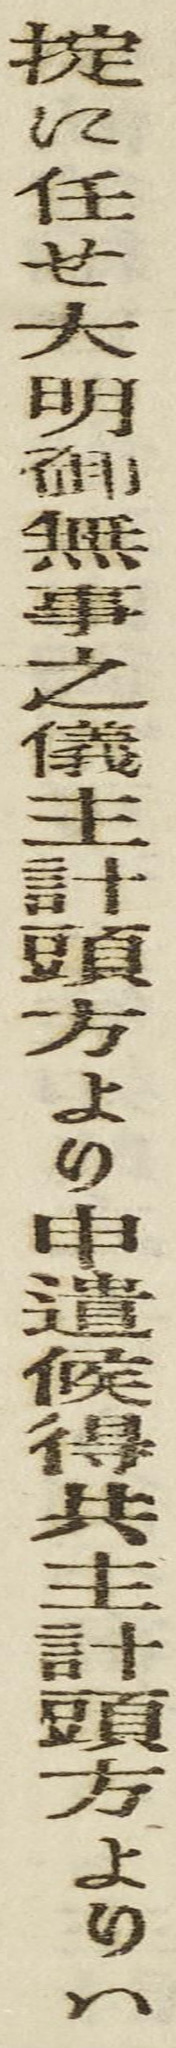掟に任せ大明御無事之儀主計頭方より申遣候得共主計頭方よりは
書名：史籍集覽　朝鮮陣古文・細井廣澤記・颶風紀事・天明七年將軍宣下次第書　全
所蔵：東京大学地震研究所図書室 Earthquake Research Institute Library, The University of Tokyo, JAPAN
